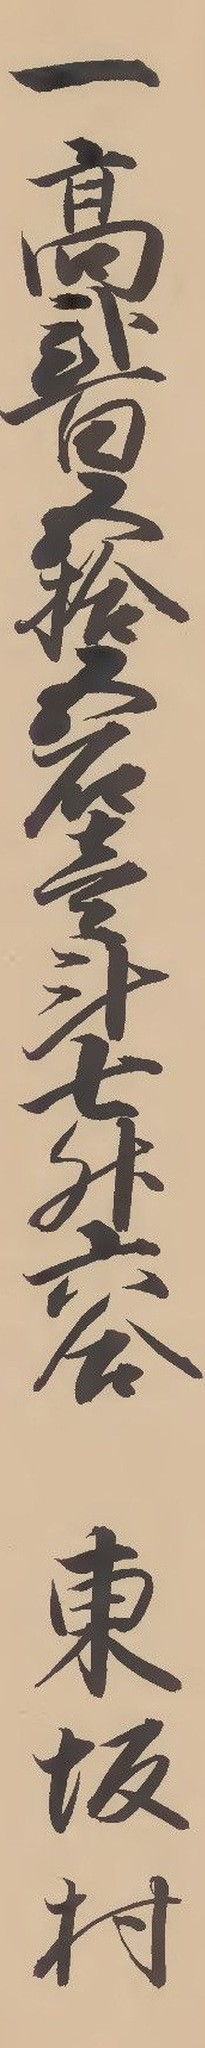一高弐百五拾五石壱斗七升六合東坂村
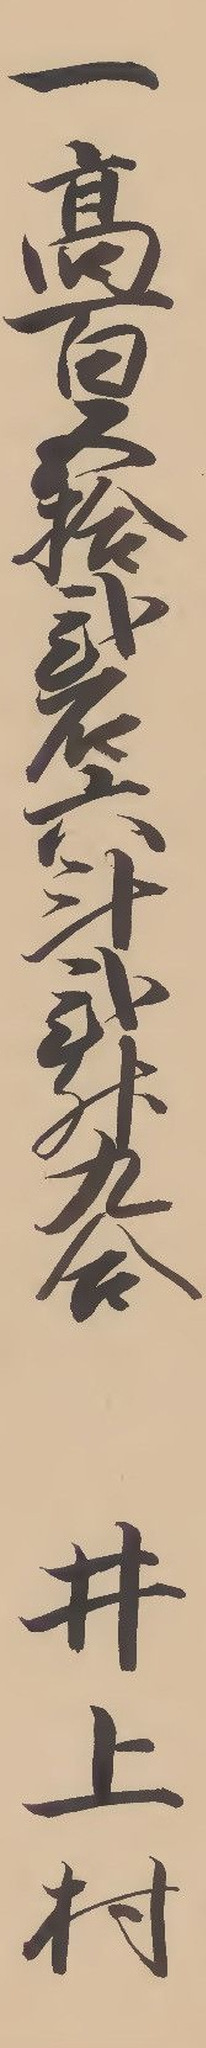一高百五拾弐石六斗弐升九合井上村

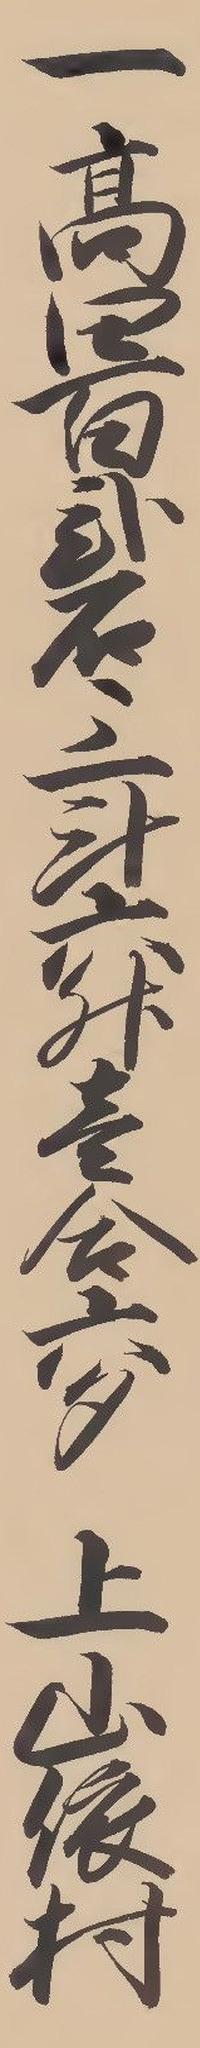一高四百弐石三斗六升壱合六勺上山依村
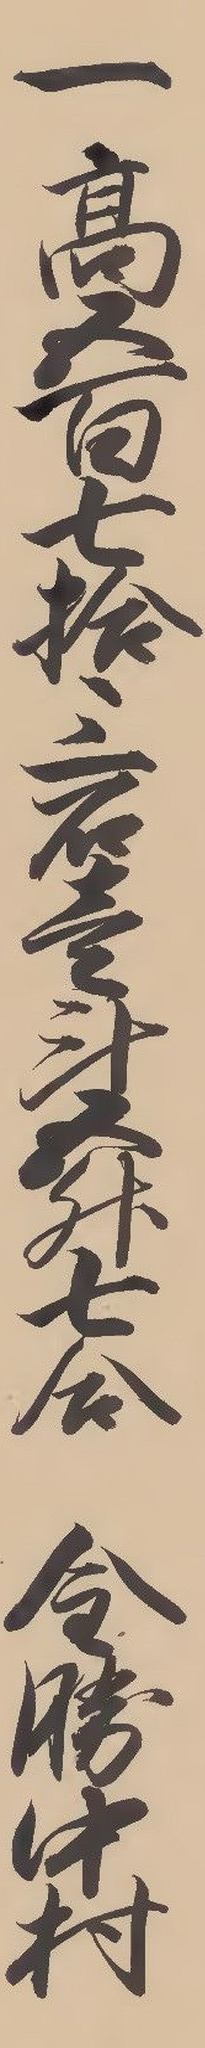一高五百七拾三石壱斗五升七合金勝中村
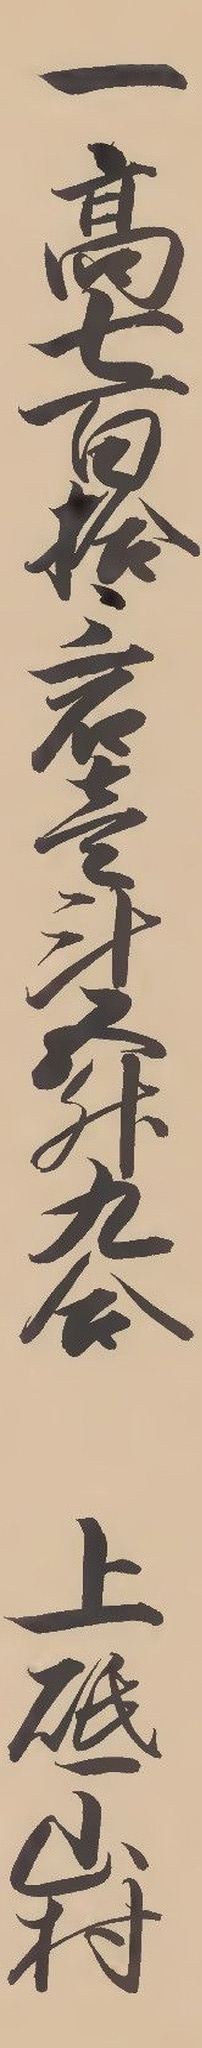一高七百拾三石壱斗五升九合上砥山村
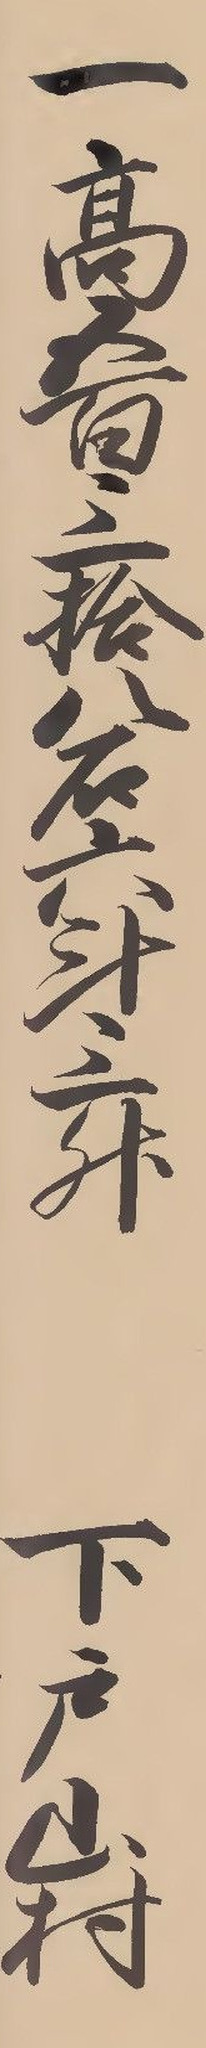一高五百三拾八石六斗三升下戸山村
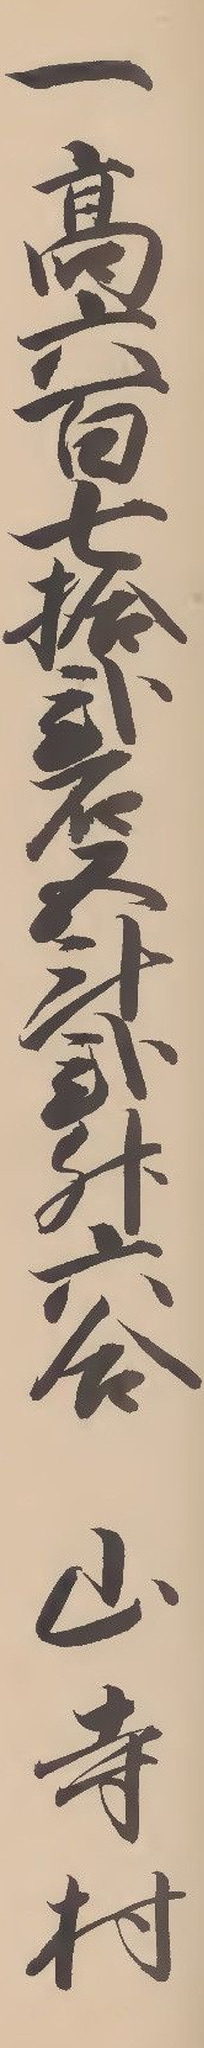一高六百七拾弐石五斗弐升六合山寺村
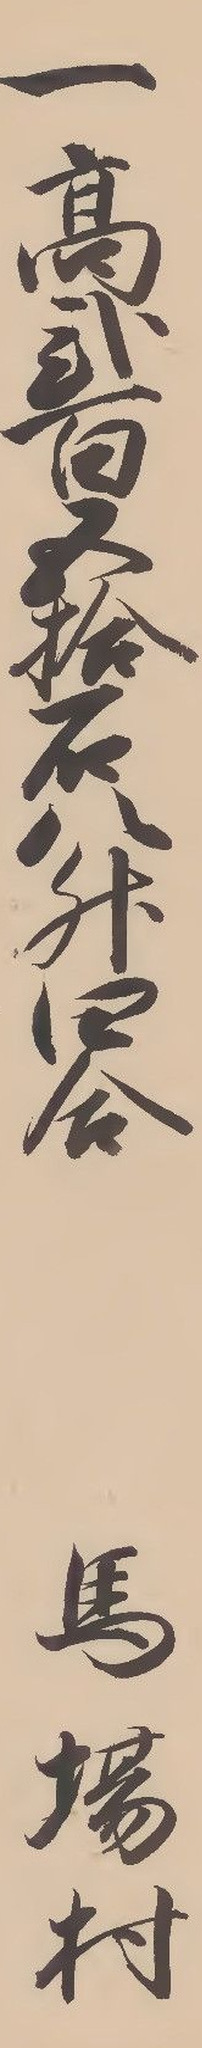一高弐百五拾石八升四合馬場村
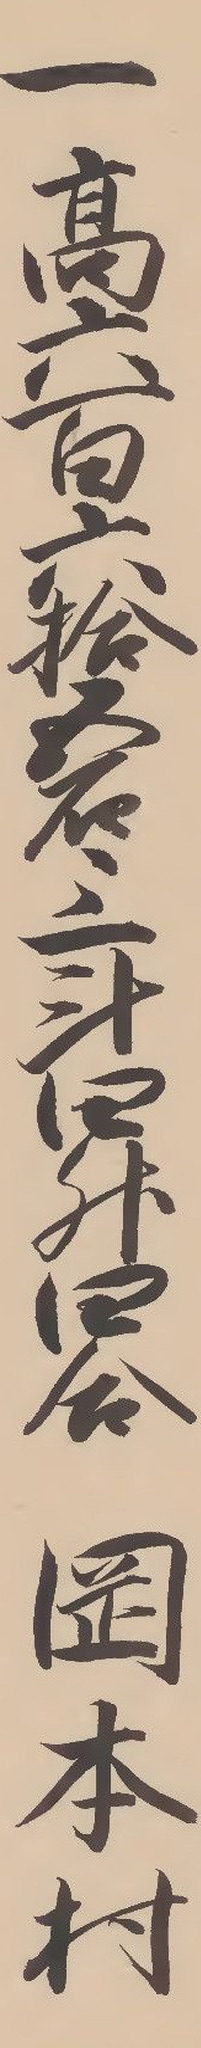一高六百六拾五石三斗四升四合岡本村
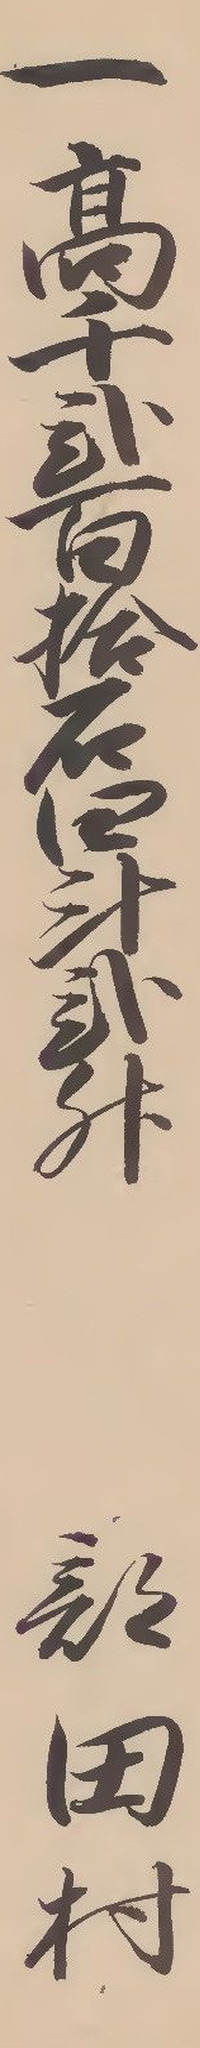一高千弐百拾石四斗弐升部田村

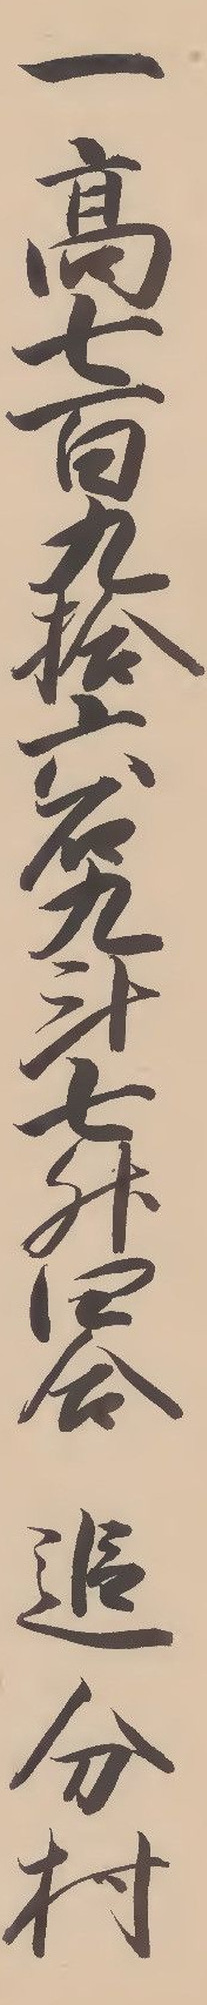一高七百九拾六石九斗七升四合追分村
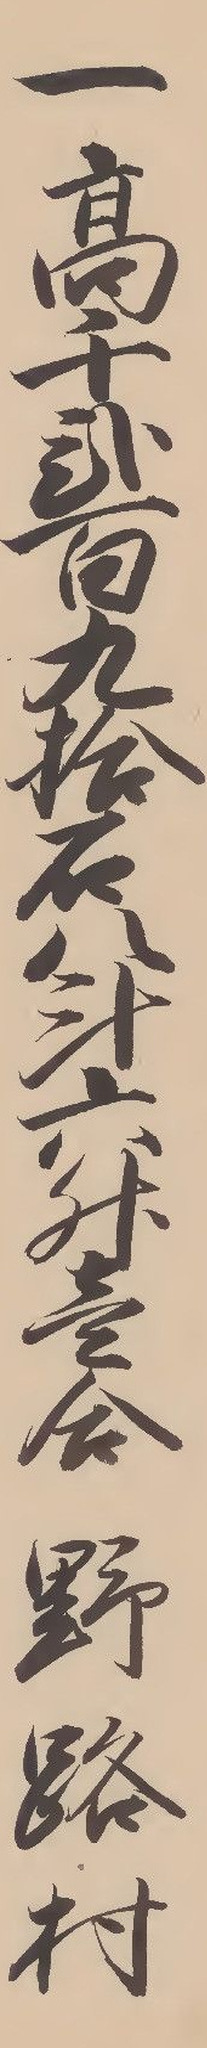一高千弐百九拾石八斗六升壱合野路村
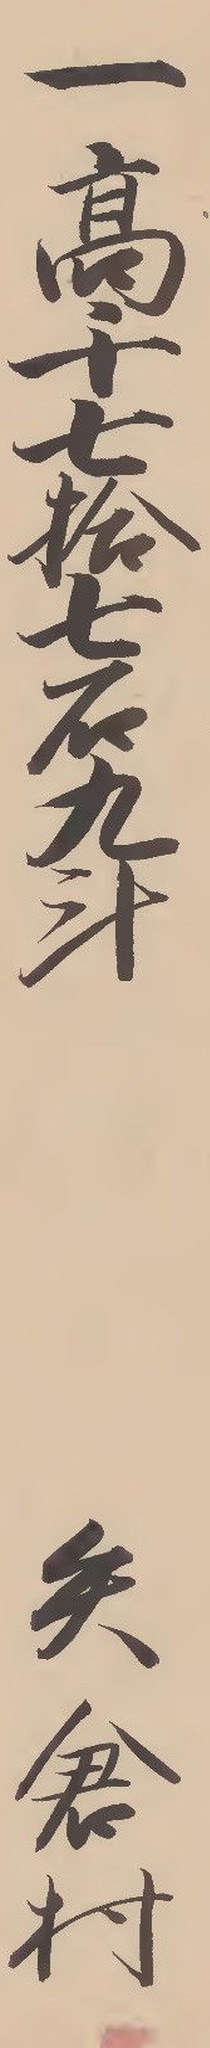一高千七拾七石九斗矢倉村
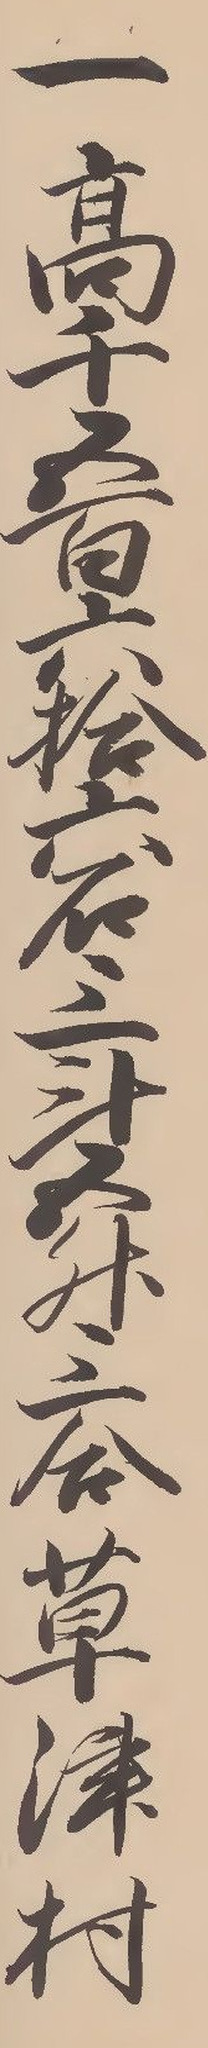一高千五百六拾六石三斗五升三合草津村
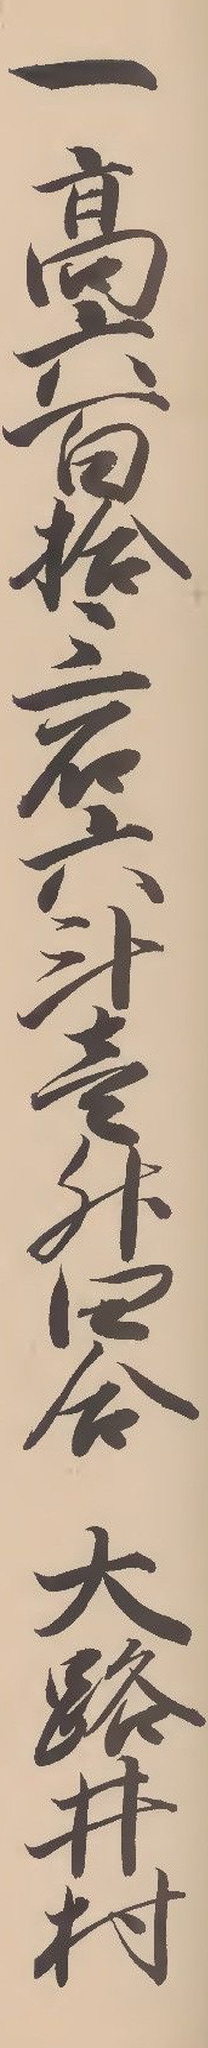一高六百拾三石六斗壱升四合大路井村
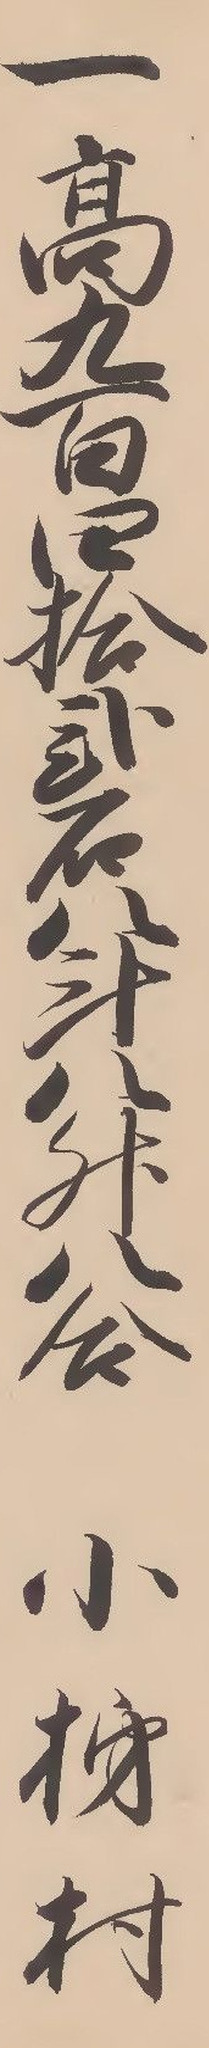一高九百四拾弐石八斗八升八合小柿村
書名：近江国郷帳
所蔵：国立公文書館 National Archives of Japan
